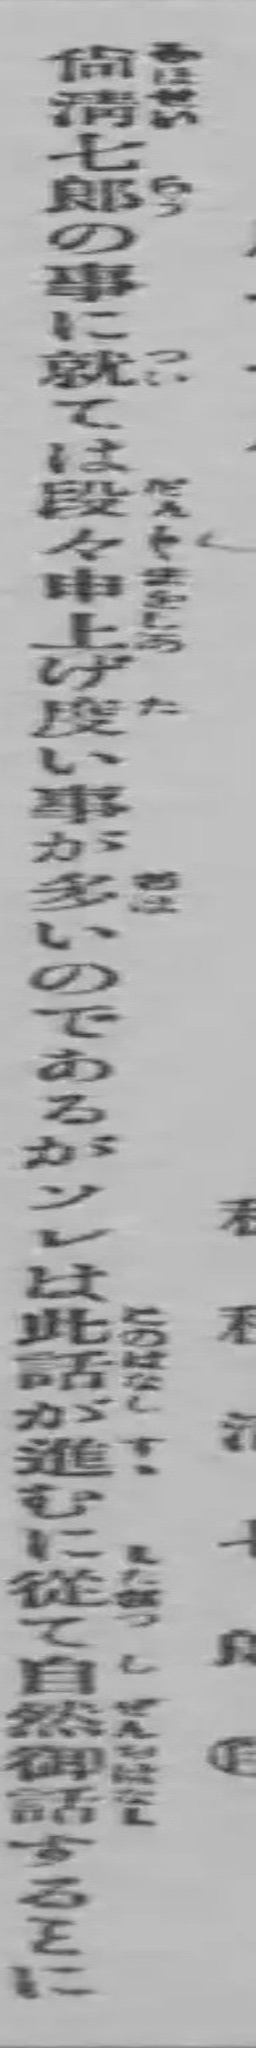尚清七郎の事に就ては段々申上げ度い事が多いのであるがソレは此話が進むに従て自然御話することに
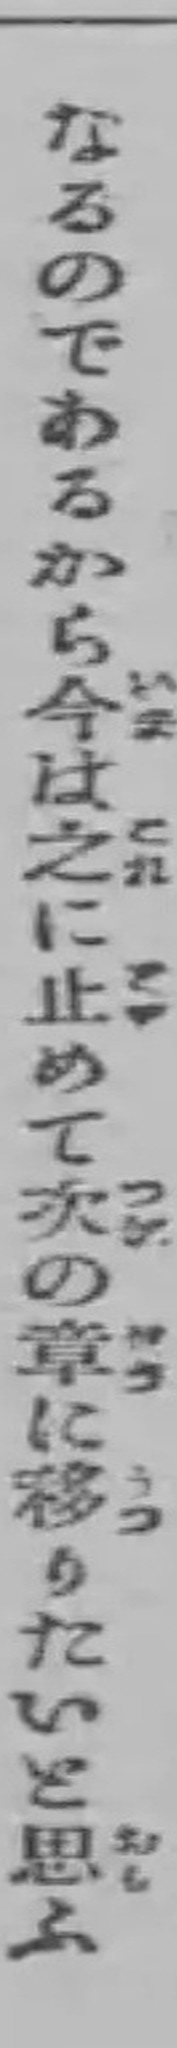なるのであるから今は之に止めて次の章に移りたいと思ふ
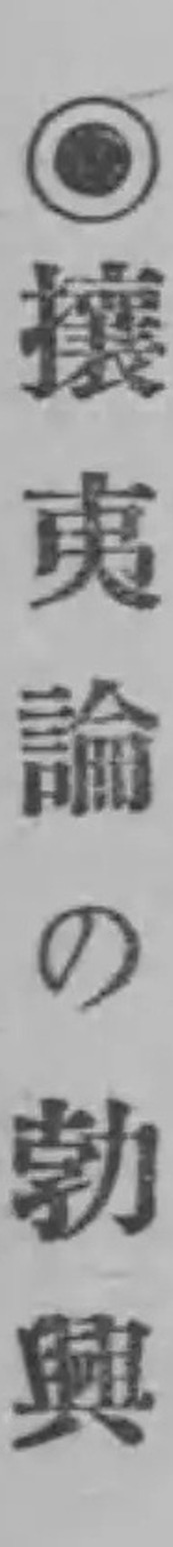⦿攘夷論の勃興

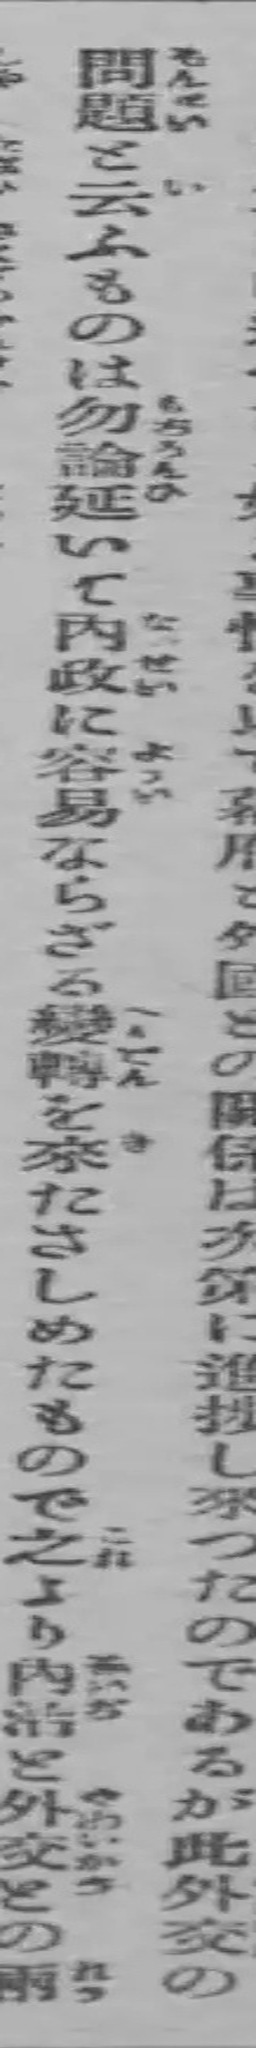問題と云ふものは勿論延いて内政に容易ならざる変転を来たさしめたもので之より内治と外交との両
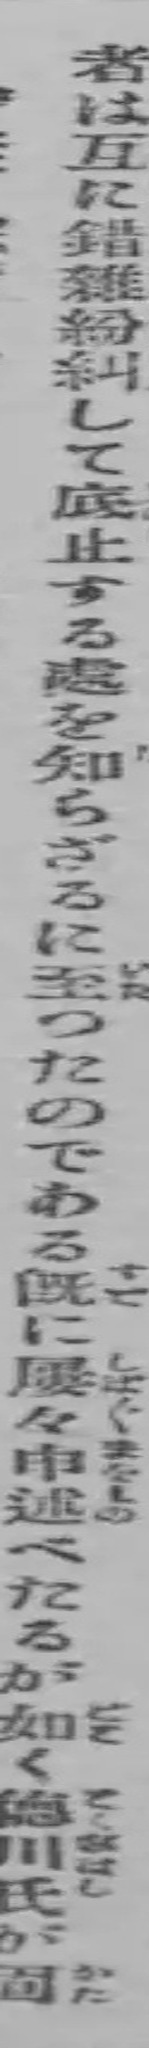者は互に錯雑紛糾して底止する処を知らざるに至つたのである既に屡々申述べたるが如く徳川氏が固
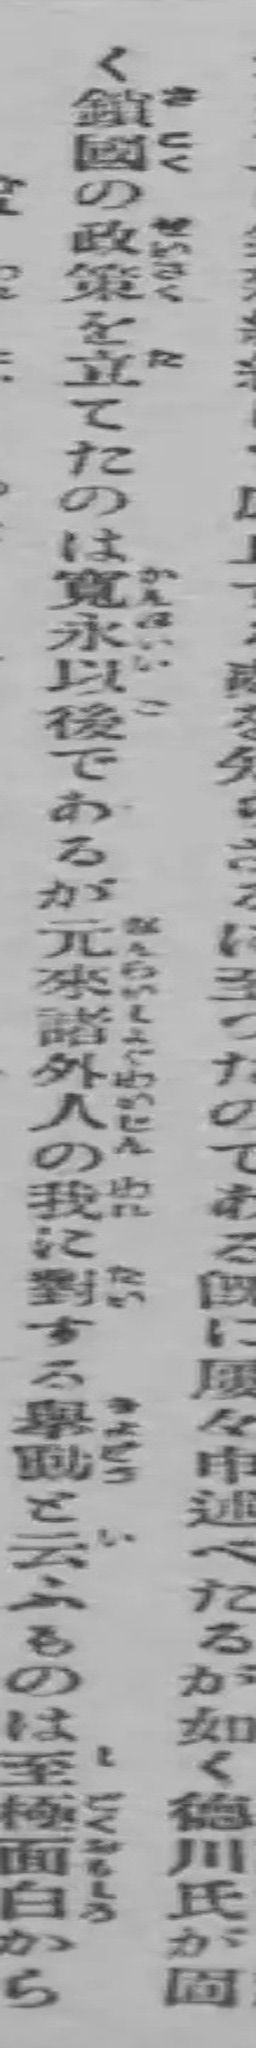く鎖国の政策を立てたのは寛永以後であるが元来諸外人の我に対する挙動と云ふものは至極面白から
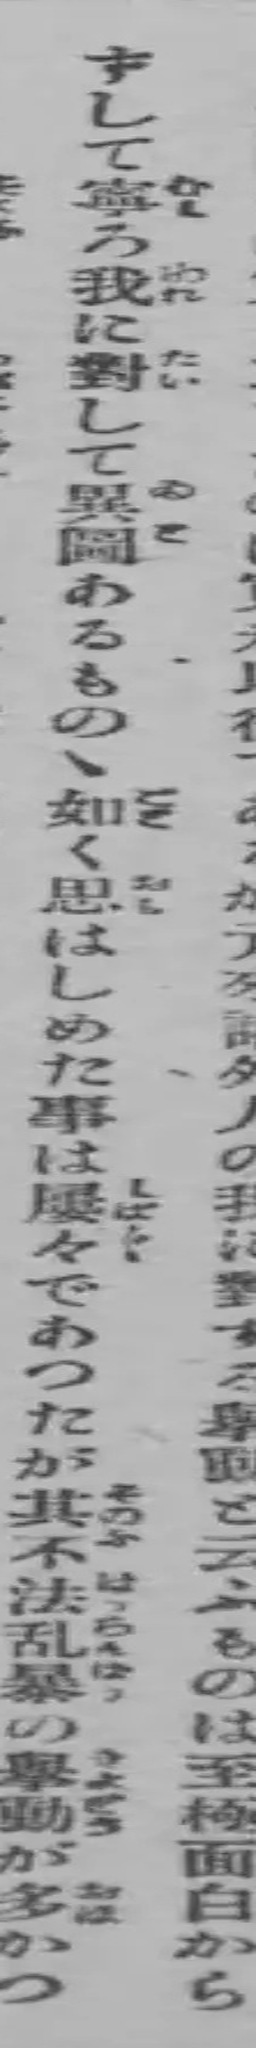ずして寧ろ我に対して異図あるものゝ如く思はしめた事は屡々であつたが其不法乱暴の挙動が多かつ
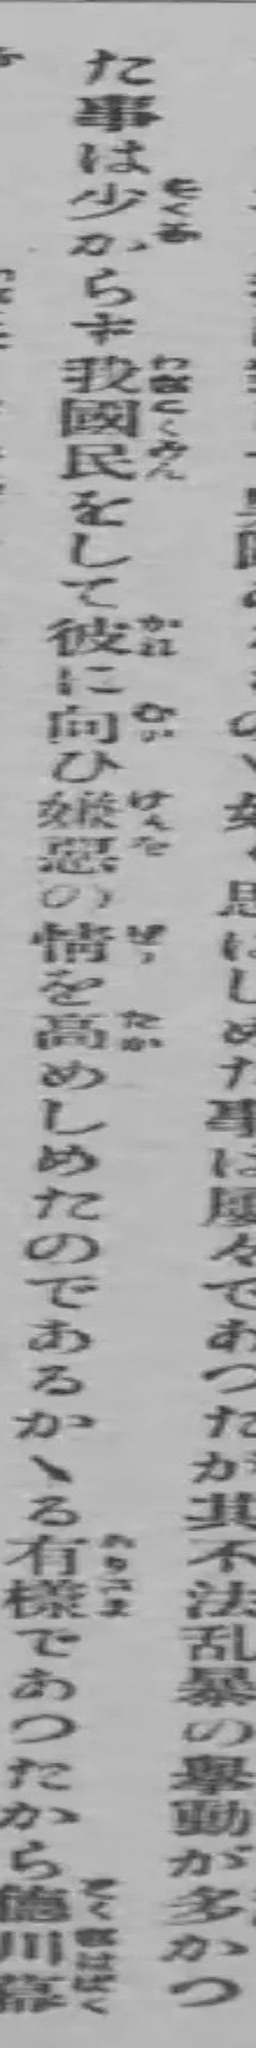た事は少からず我国民をして彼に向ひ嫌悪の情を高めしめたのであるかゝる有様であつたから徳川幕
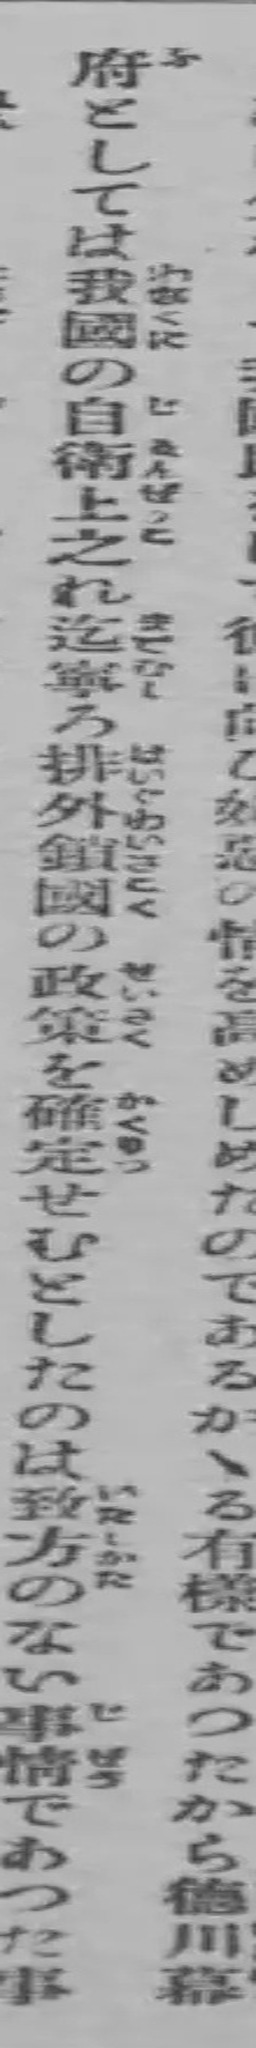府としては我国の自衛上之れ迄寧ろ排外鎖国の政策を確定せむとしたのは致方のない事情であつた事
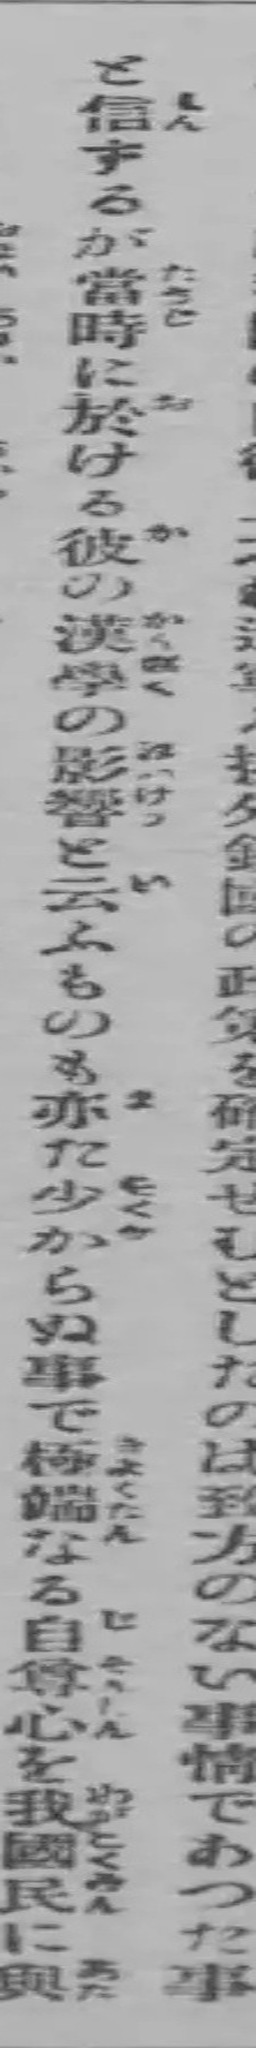と信ずるが当時に於ける彼の漢学の影響と云ふものも亦た少からぬ事で極端なる自尊心を我国民に与
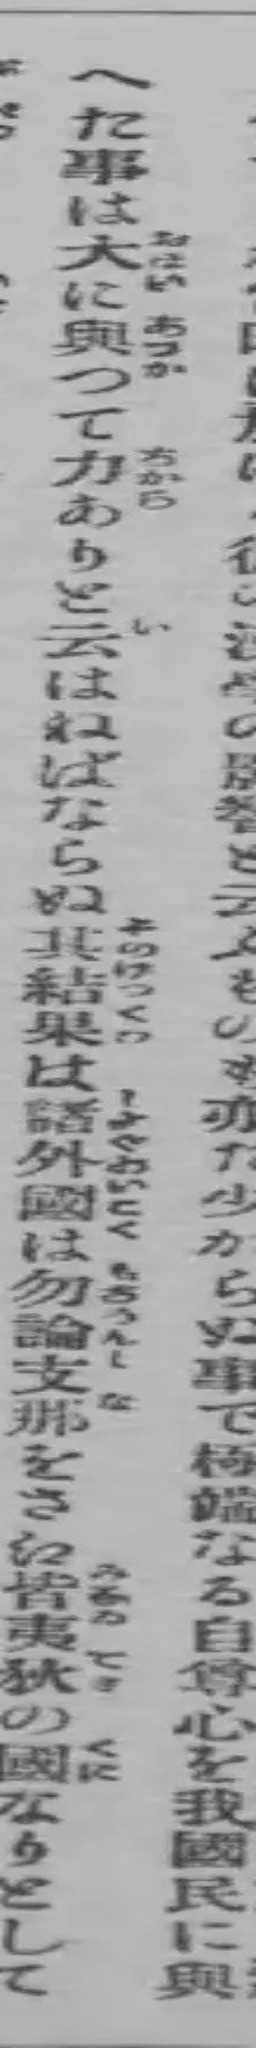へた事は大に与つて力ありと云はねばならぬ其結果は諸外国は勿論支那をさえ皆夷狄の国なりとして
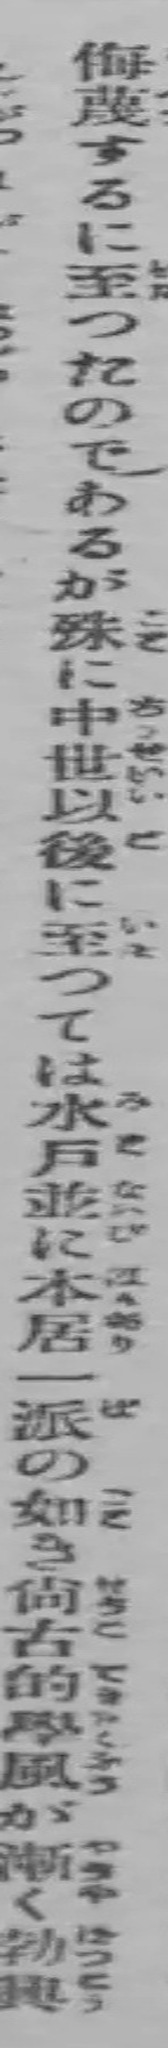侮蔑するに至つたのであるが殊に中世以後に至つては水戸並に本居一派の如き尚古的学風が漸く勃興
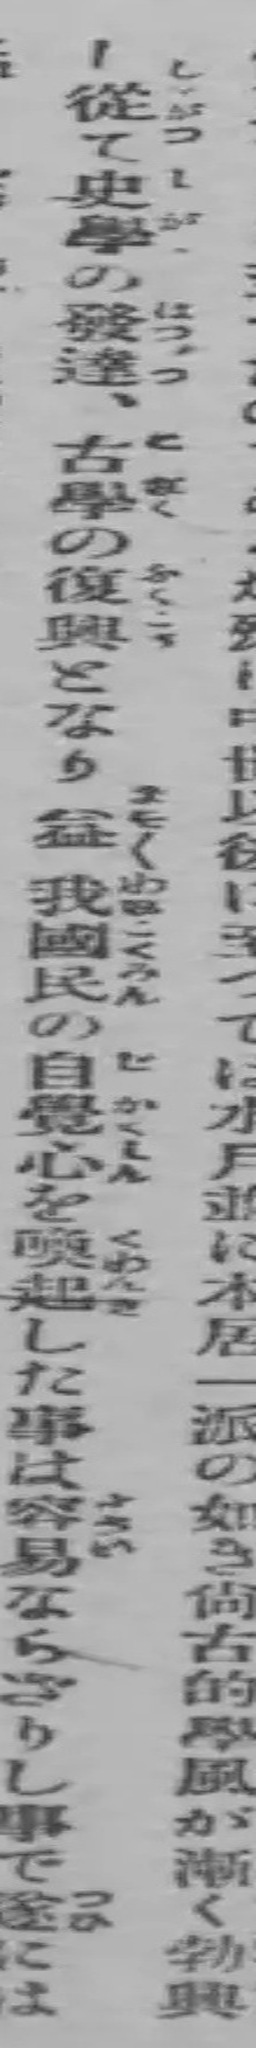し従て史学の発達、古学の復興となり益我国民の自覚心を喚起した事は容易ならざりし事で遂には
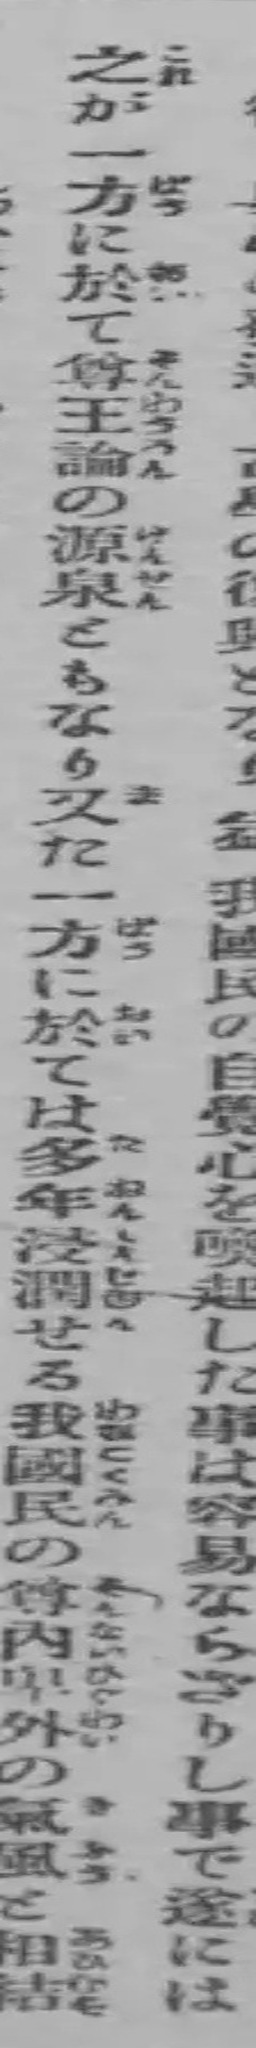之が一方に於て尊王論の源泉ともなり又た一方に於ては多年浸潤せる我国民の尊内卑外の気風と相結
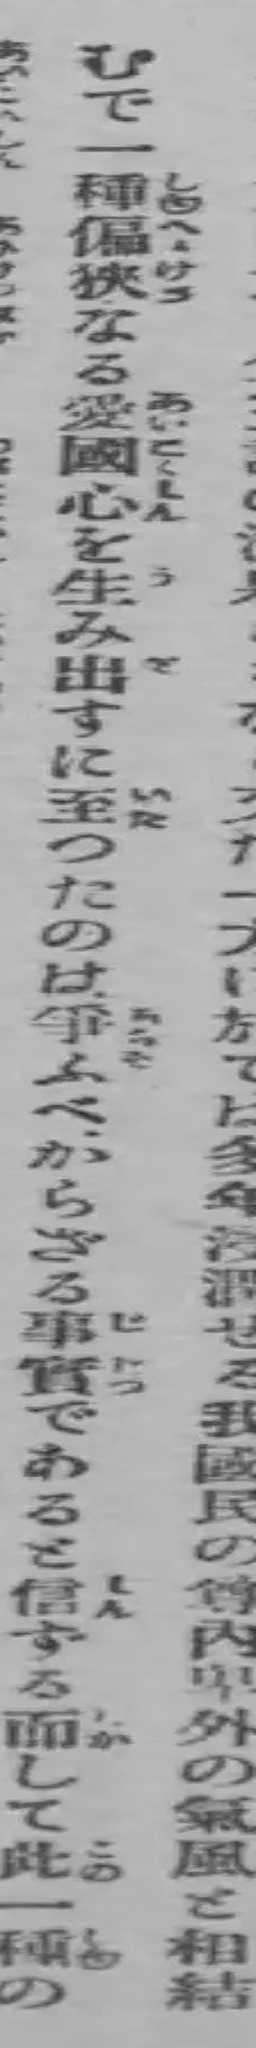むで一種偏狭なる愛国心を生み出すに至つたのは争ふべからざる事実であると信ずる而して此一種の
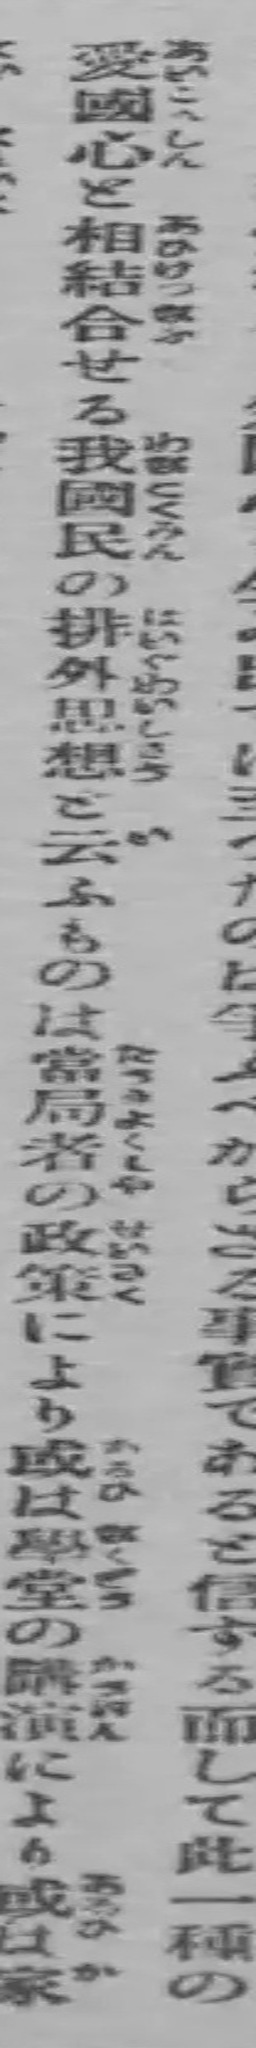愛国心と相結合せる我国民の排外思想と云ふものは当局者の政策により或は学堂の講演により或は家
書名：豊橋市史談
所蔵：国立国会図書館 National Diet Library, JAPAN
